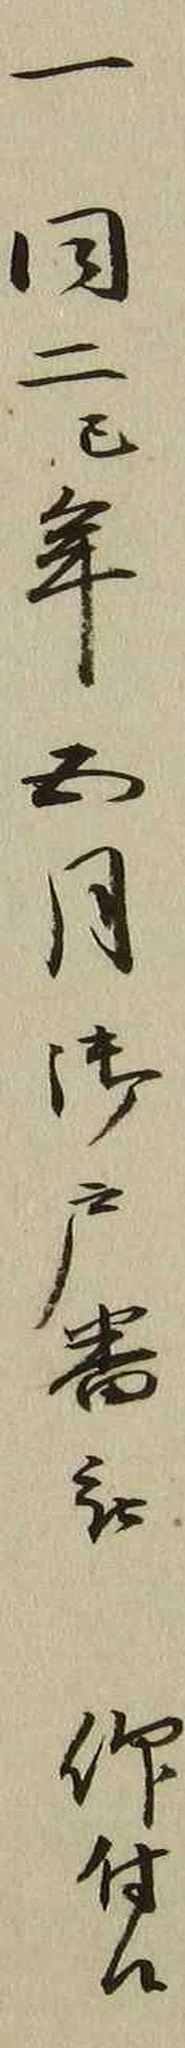一同二巳年五月御戸番被仰付候
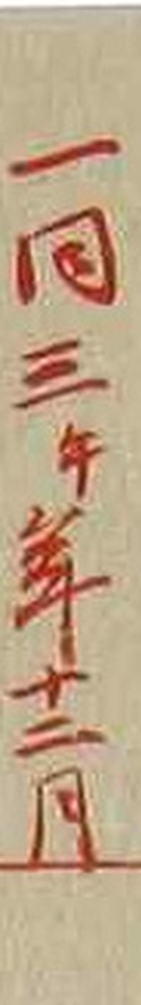一同三午年十二月
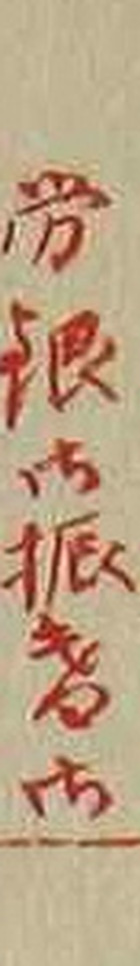労銀御振替御
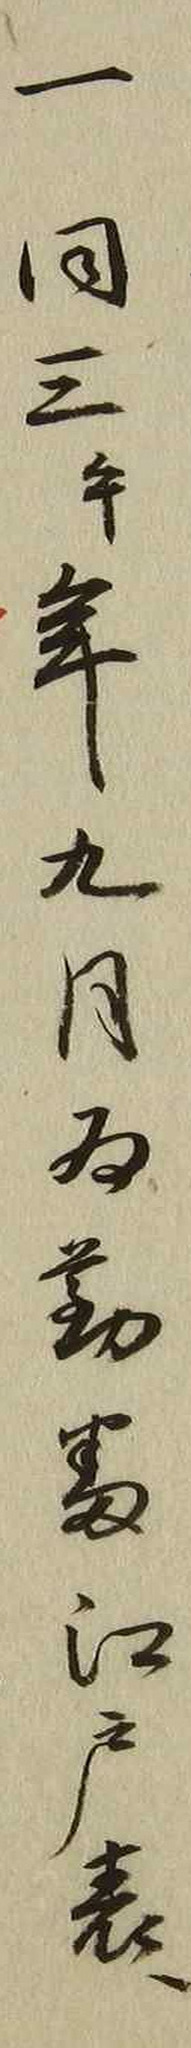一同三午年九月為勤番江戸表へ
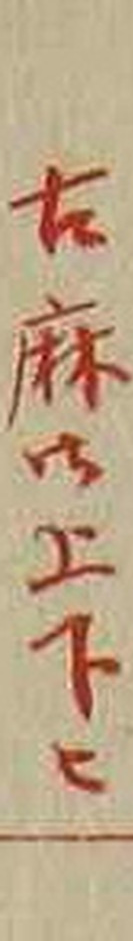古麻御上下被
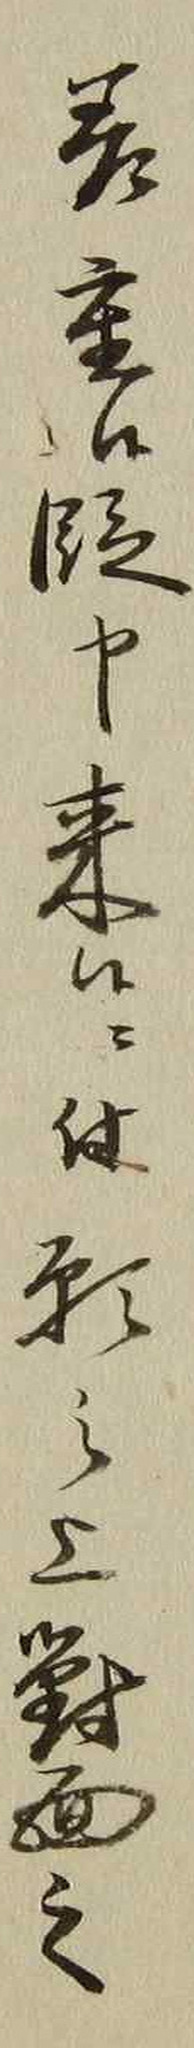差重候段申来候ニ付願之上対面之
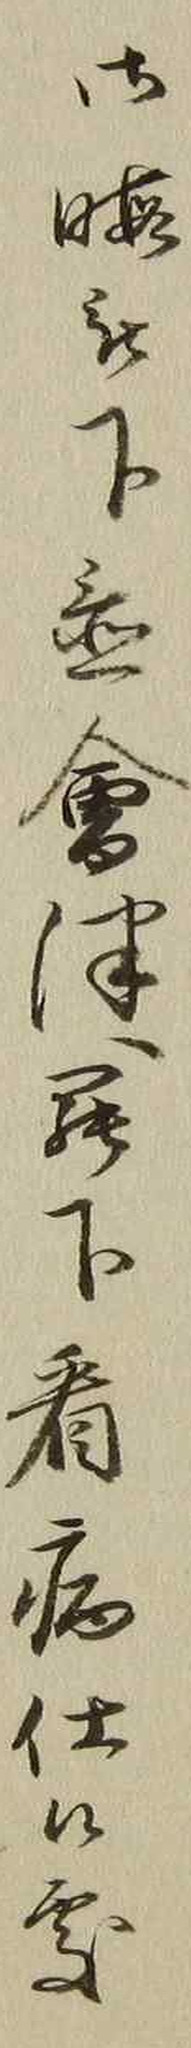御暇被下置会津へ罷下看病仕候処
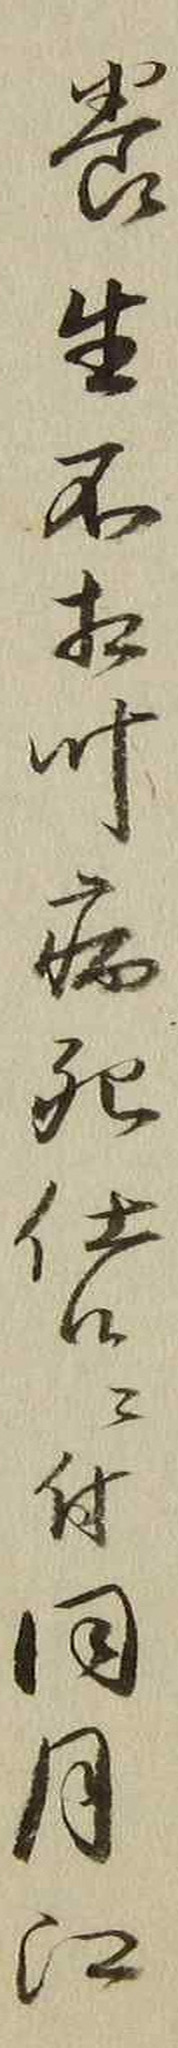養生不相叶病死仕候ニ付同月江
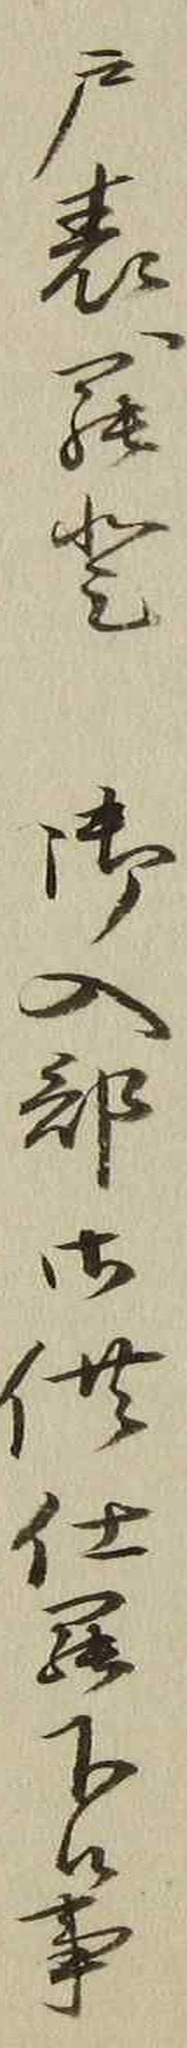戸表へ罷登御入部御供仕罷下候事
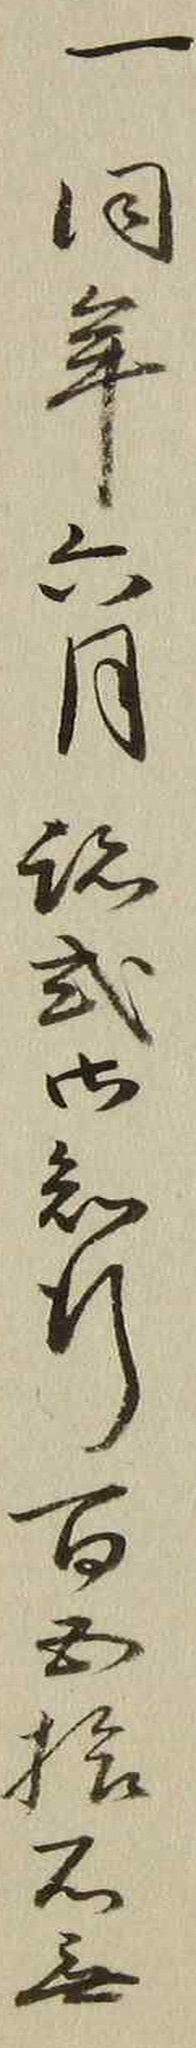一同年六月跡式御知行百五拾石無
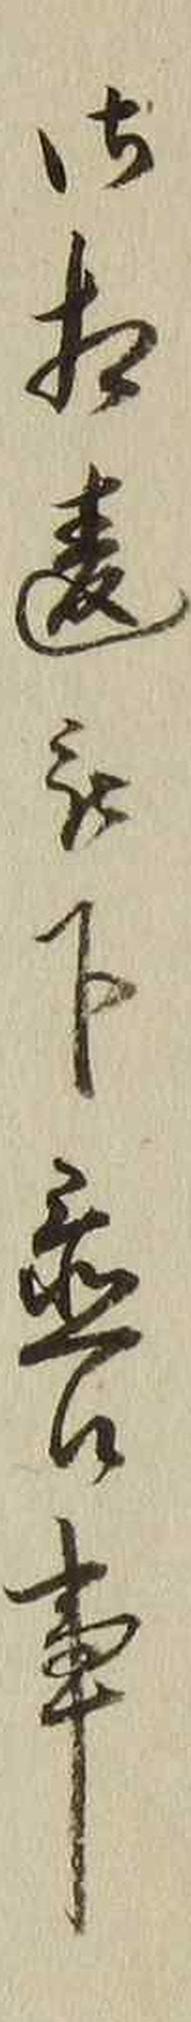御相違被下置候事
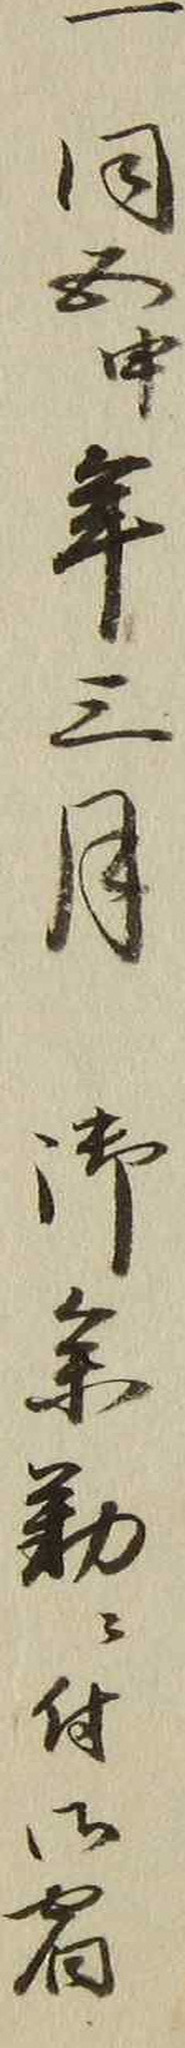一同五申年三月御参勤ニ付御宿
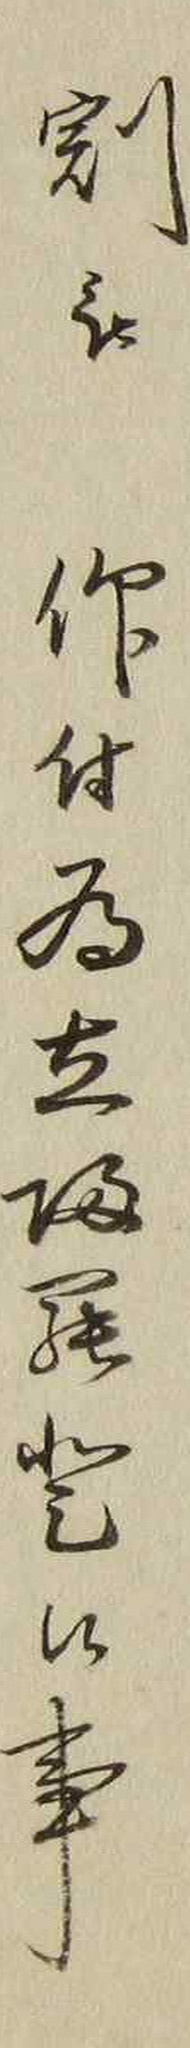割被仰付為立帰罷登候事
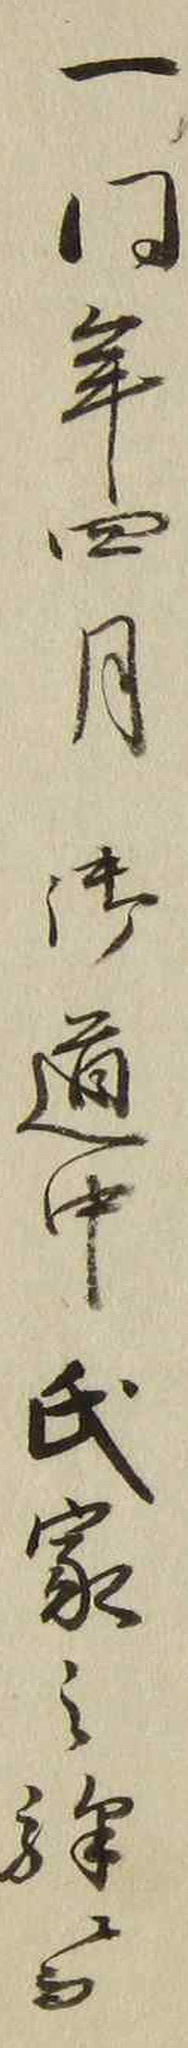一同年四月御道中氏家之駅ニ而
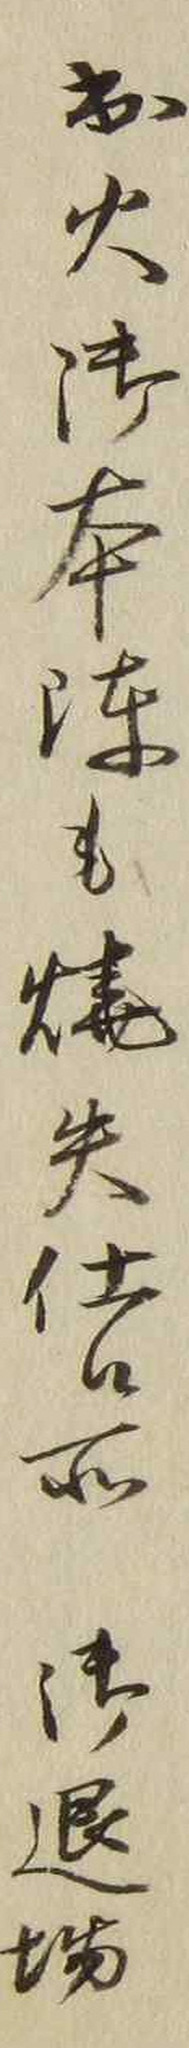出火御本陣も焼失仕候所御退場

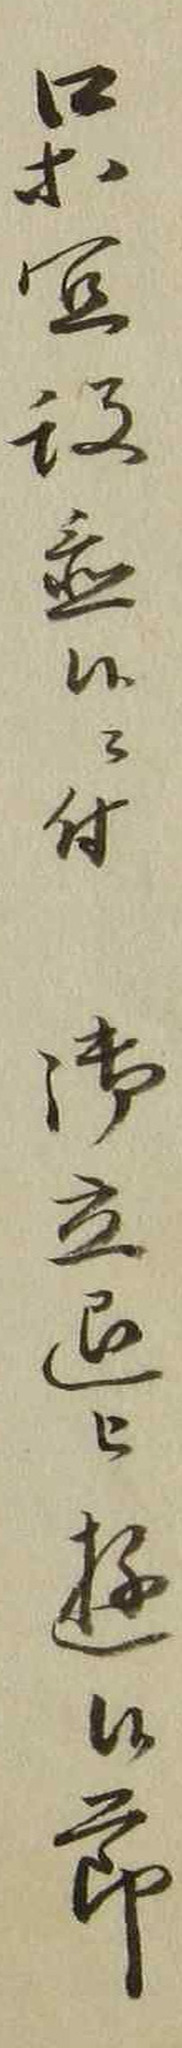口等宜設置候ニ付御立退被遊候節
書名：諸士系譜　巻之128　た之部4
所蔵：会津若松市立会津図書館
